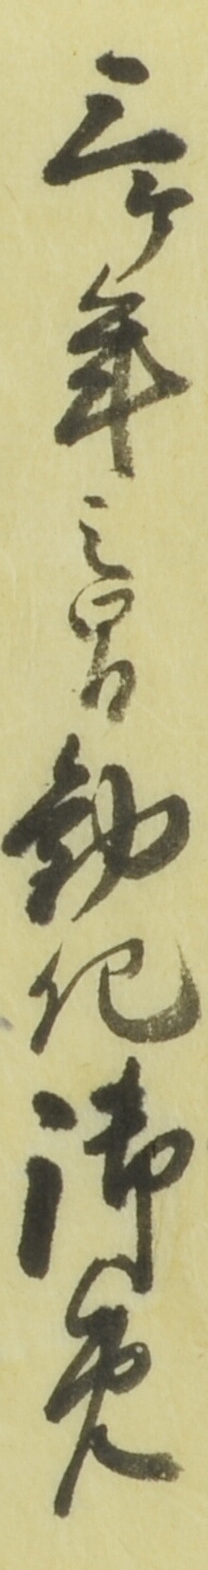三ヶ年之間勧化御免
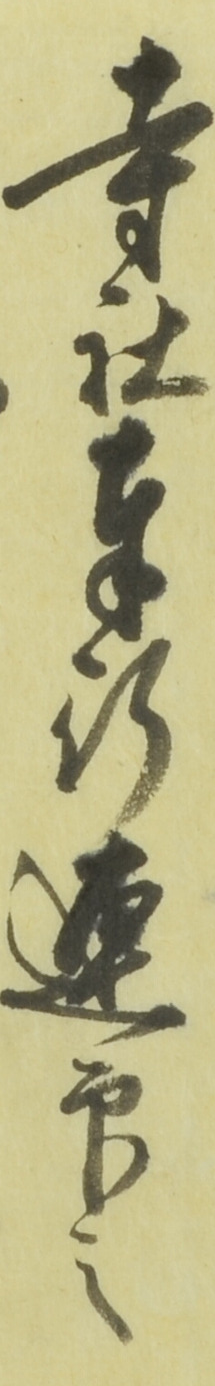寺社奉行連印之
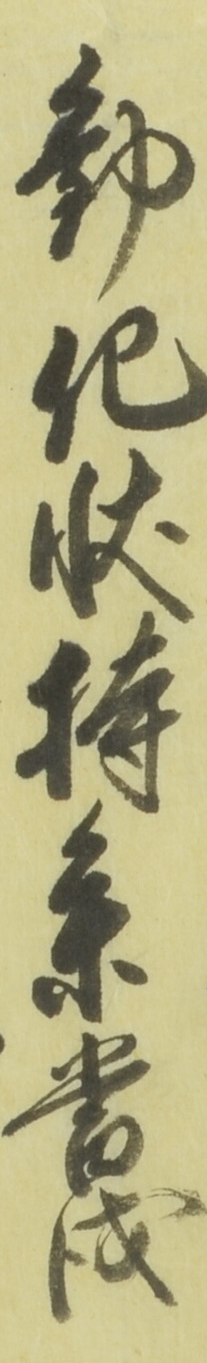勧化状持参当戌
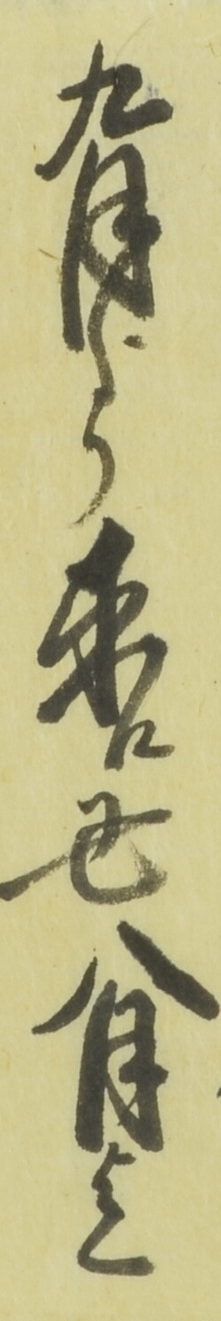九月より来ル丑八月迄
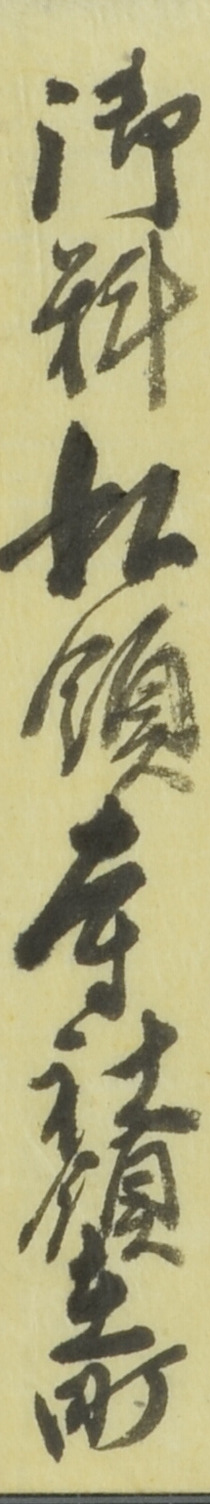御料私領寺社領在町
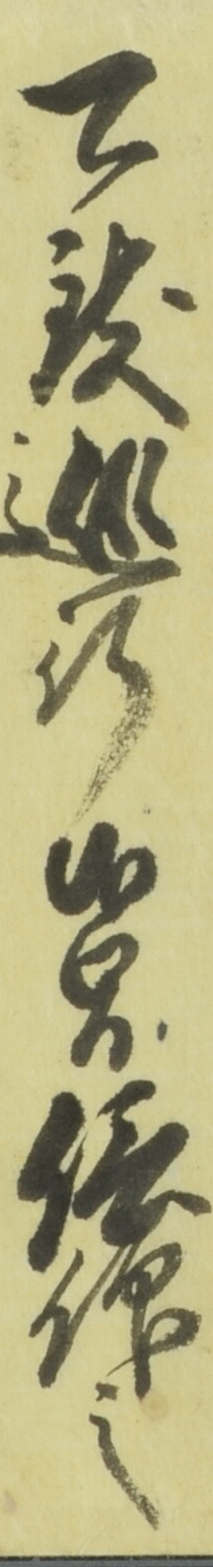可致巡行候間依仰之
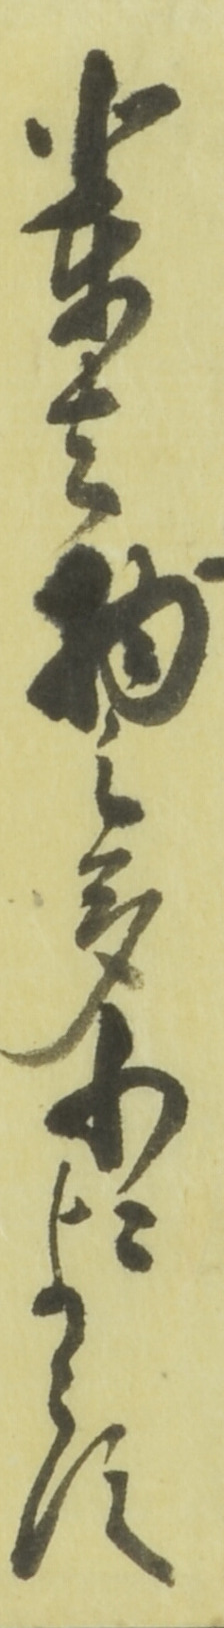輩は物之多小ニよらす
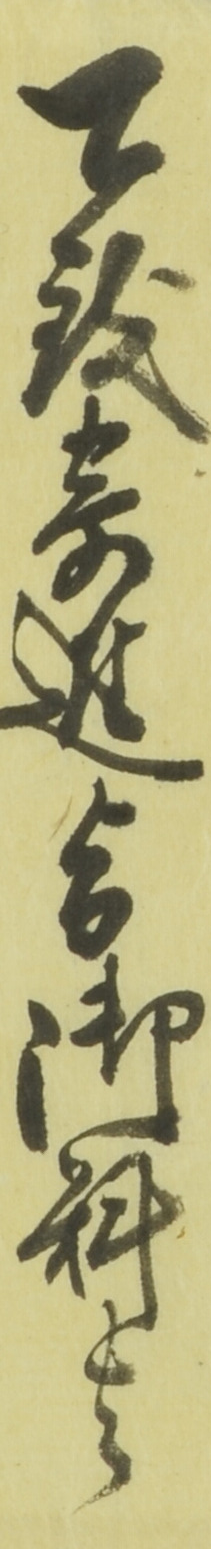可致寄進旨御料は
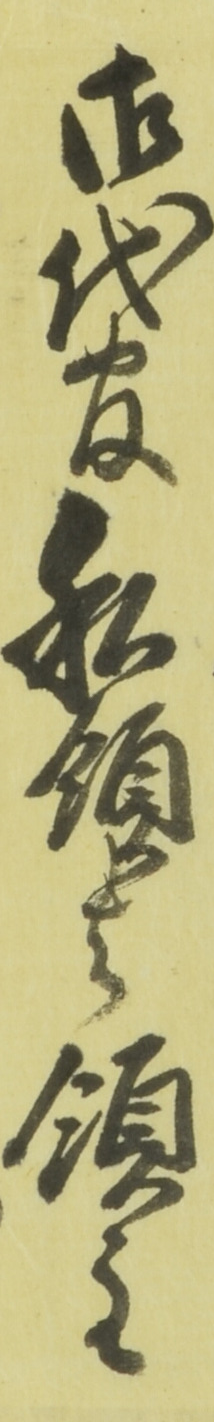御代官私領は領主
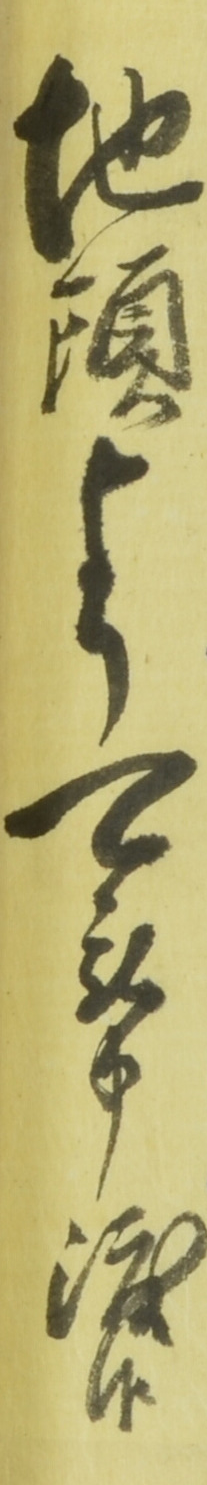地頭より可被申渡候
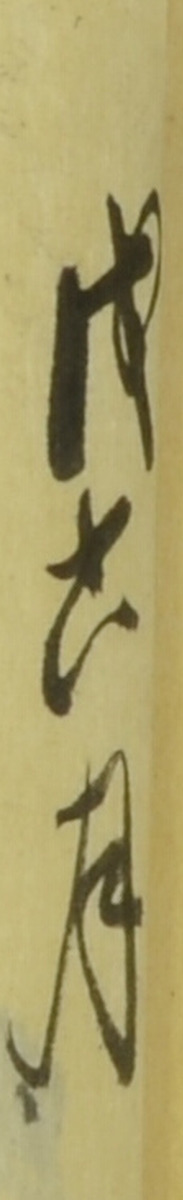亥六月
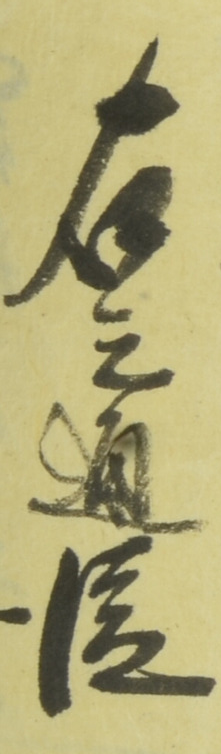右之通従

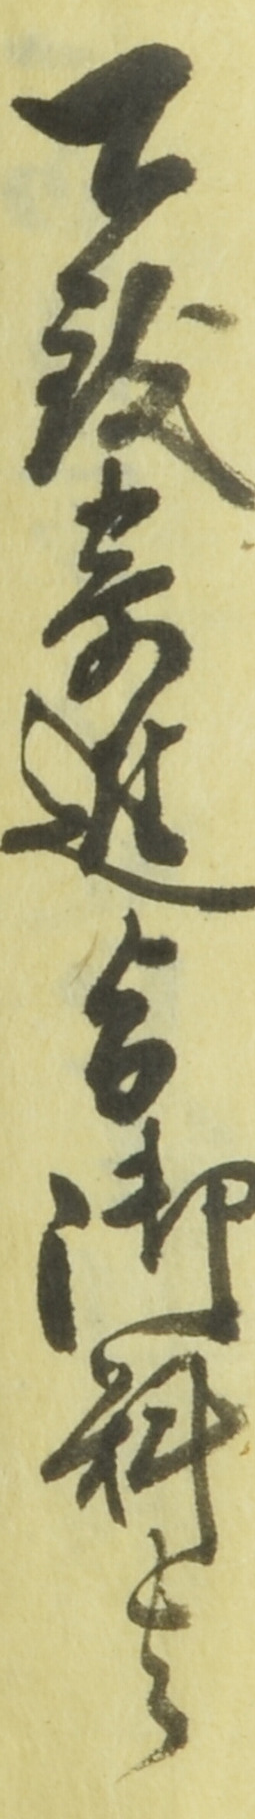可致寄進旨御料は
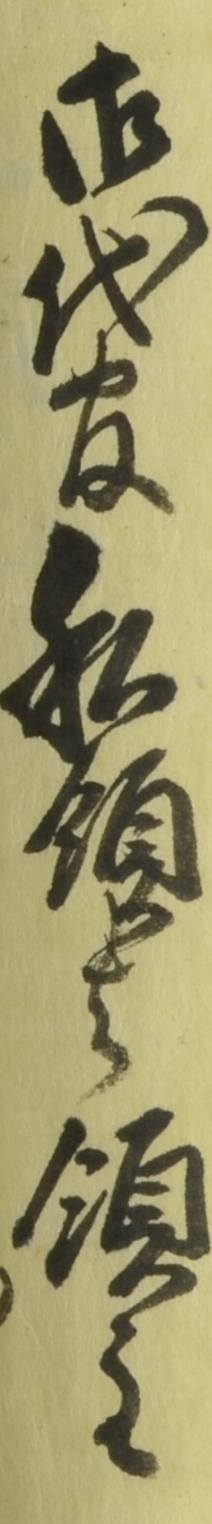御代官私領は領主
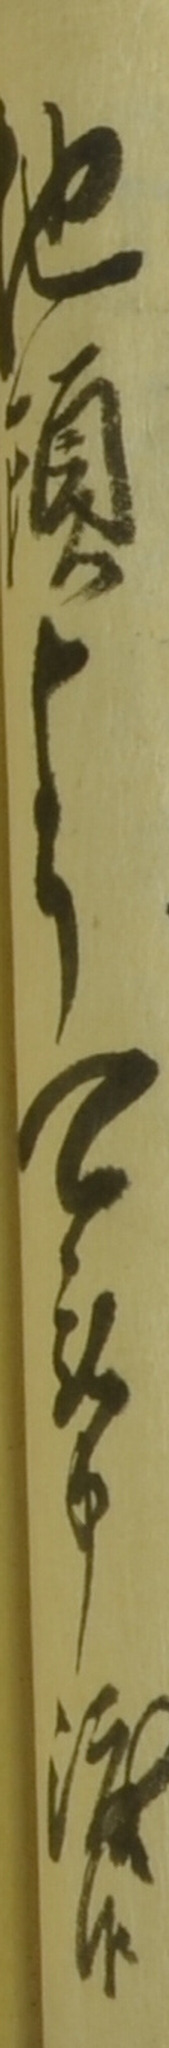地頭より可被申渡候
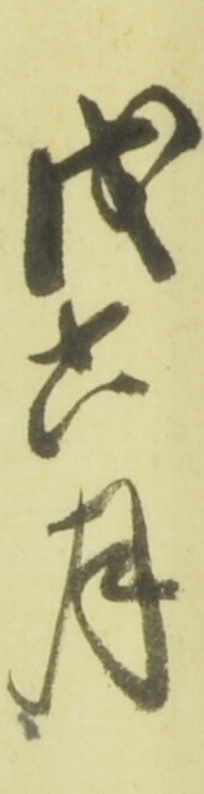亥六月
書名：御触書御書附控
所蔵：伊那市立高遠町図書館・合同会社AMANE
